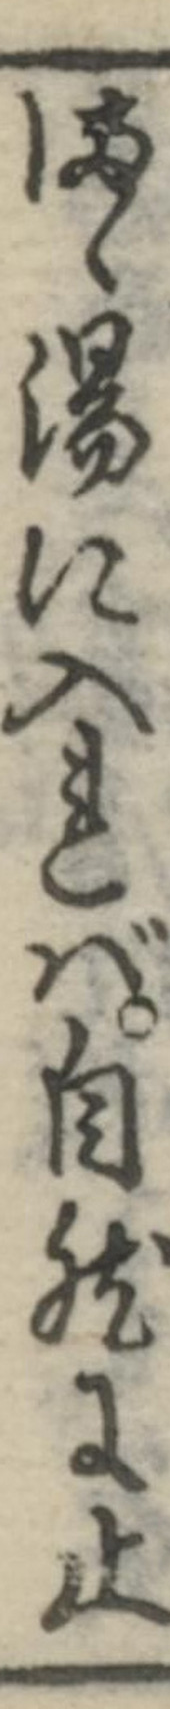まゝ湯に入れば。自然に止
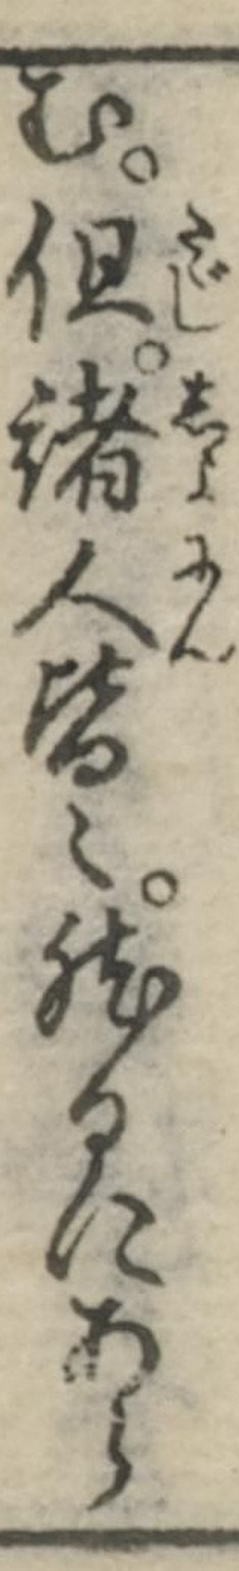む。但。諸人皆々。然るにあら
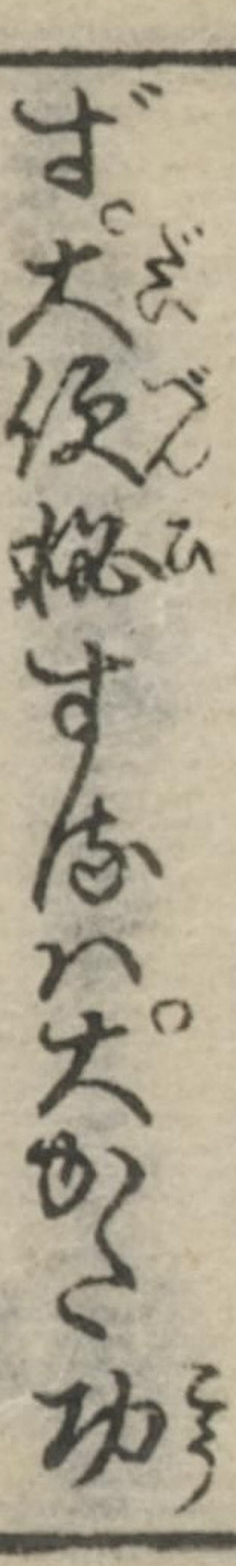ず。大便秘するは。大かた功
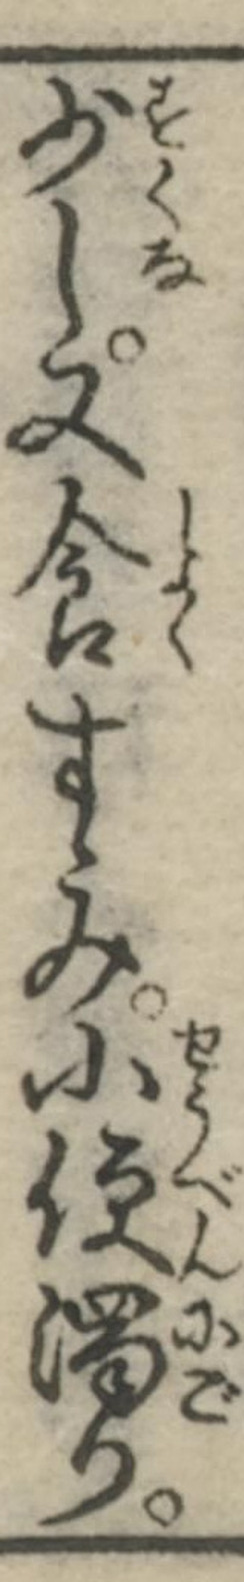少し。又食すゝみ。小便濁り。
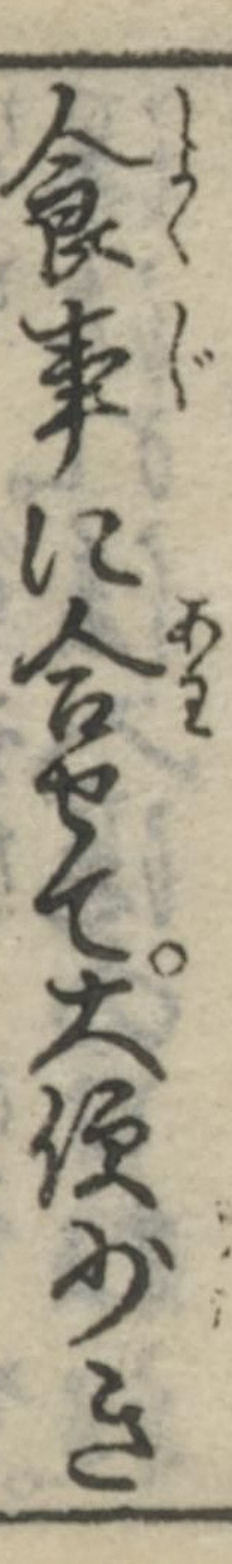食事に合せて。大便少き
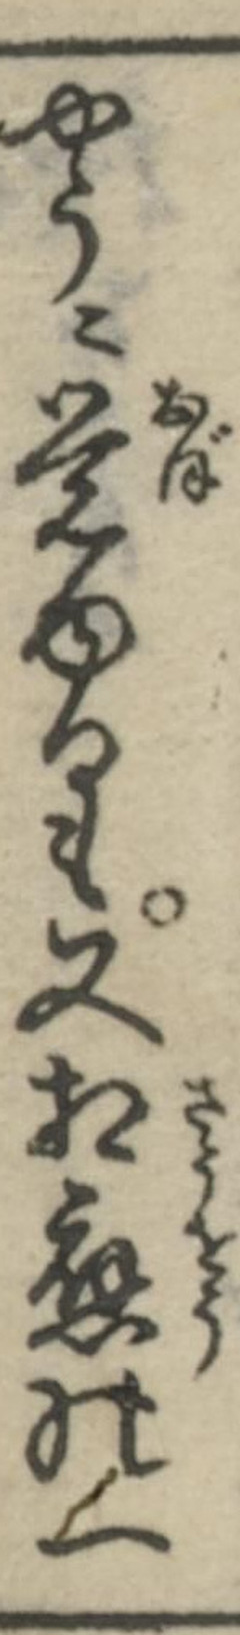やうに覚ゆるも。又相応の一

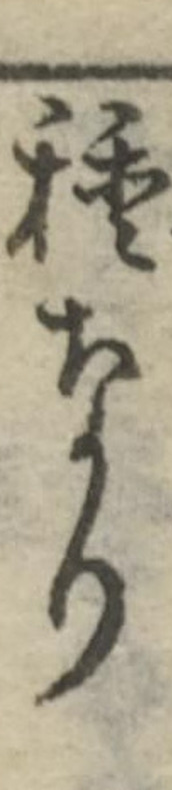種なり
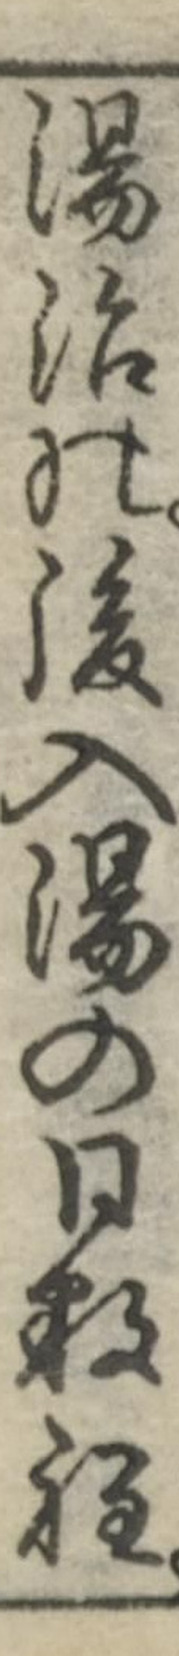湯治の。後入湯の日数程。
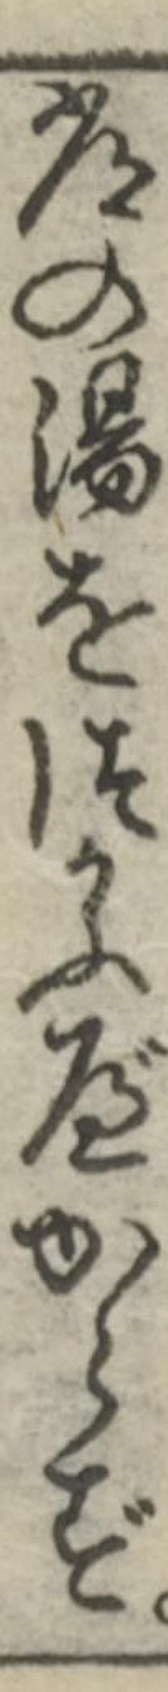常の湯をつかふべからず。
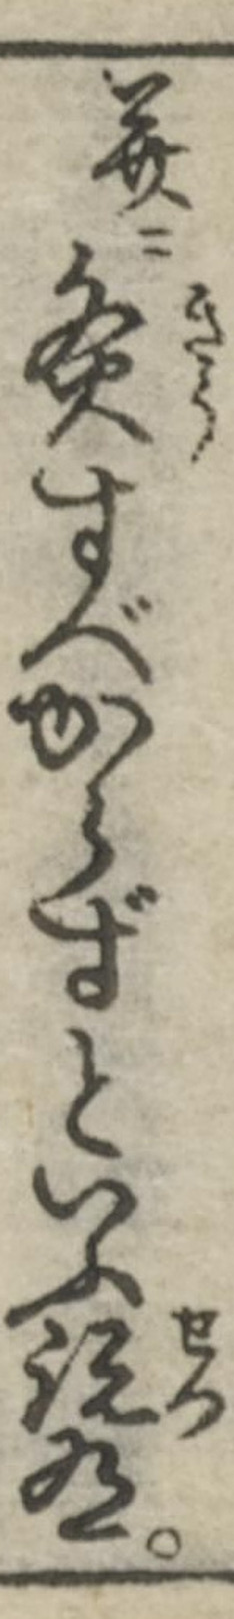幷に灸すべからずといふ説有。
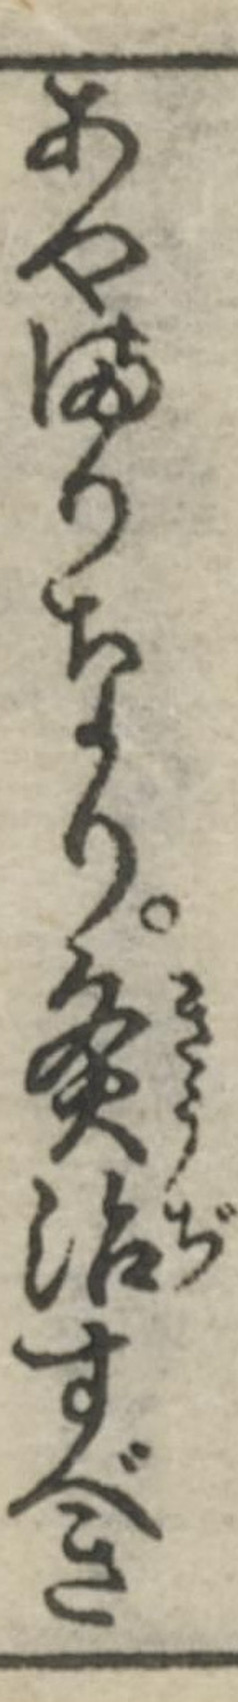あやまりなり。灸治すべき
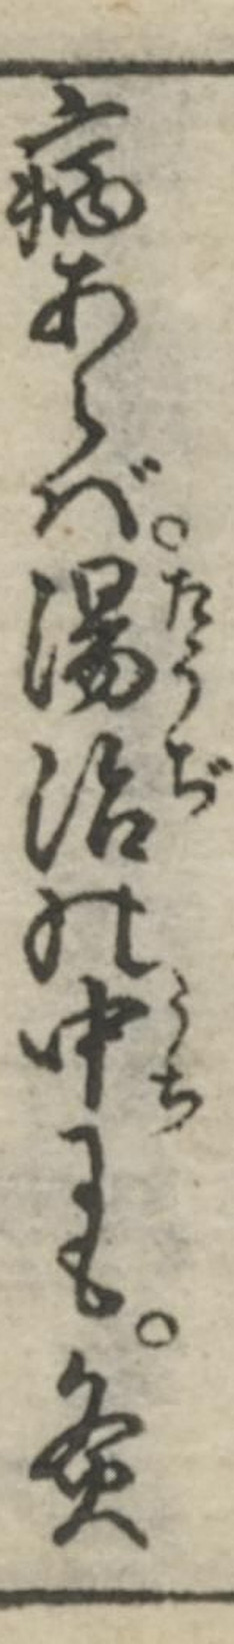病あらば。湯治の中にも。灸
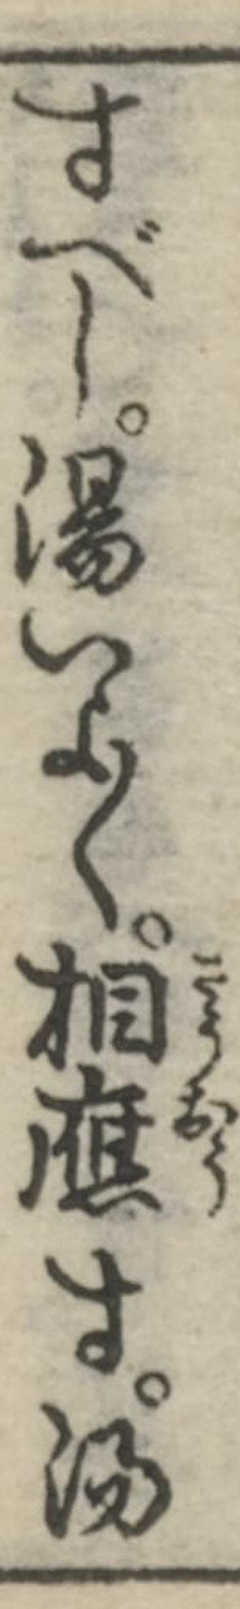すべし。湯いよ〳〵。相応す。湯
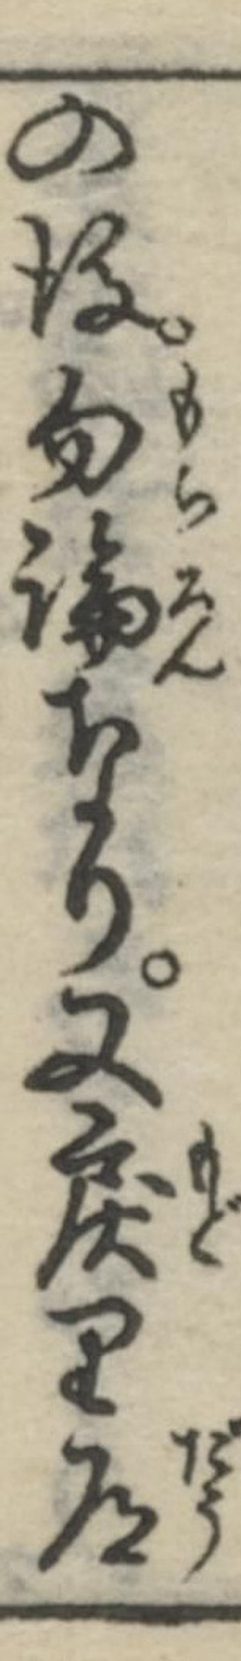の後。勿論なり。又戻り道
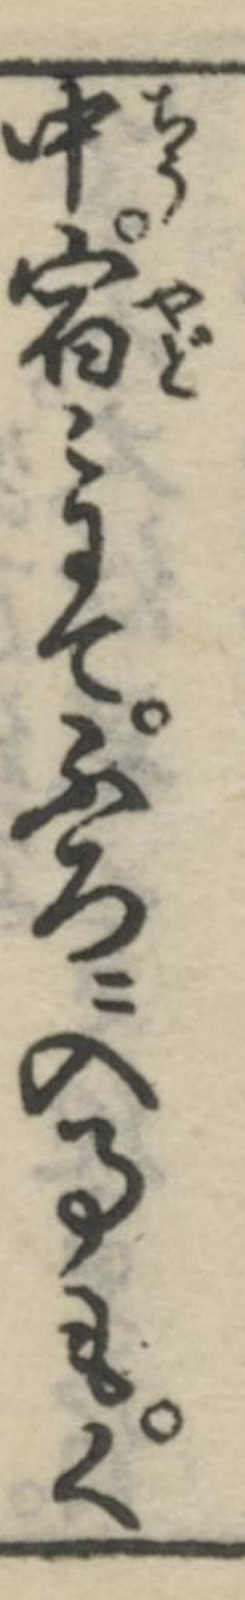中。宿々にて。ふろに入事も。く
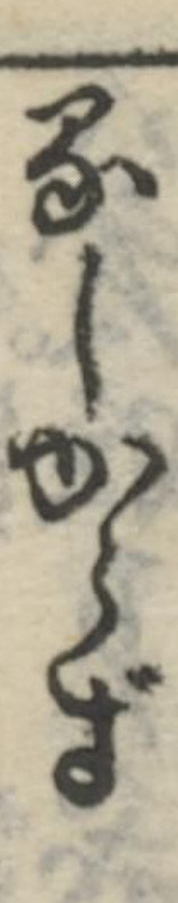るしからず
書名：但州城崎浴湯辧
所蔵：東京大学地震研究所図書室 Earthquake Research Institute Library, The University of Tokyo, JAPAN
